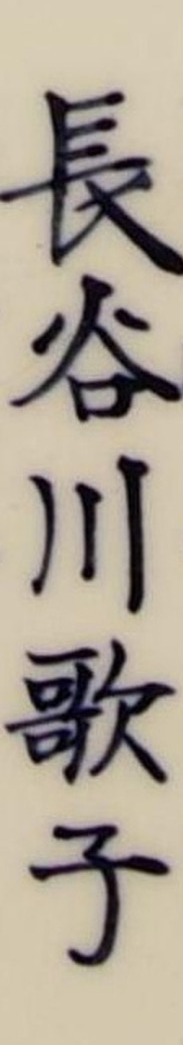長谷川歌子
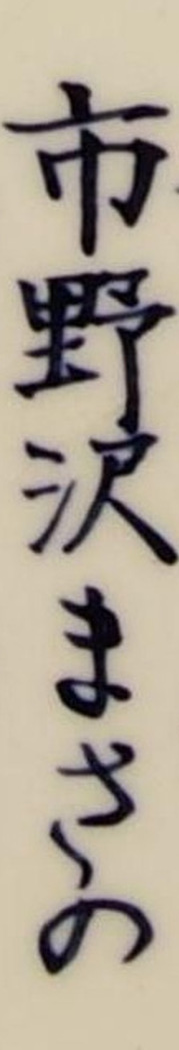市野沢まさの
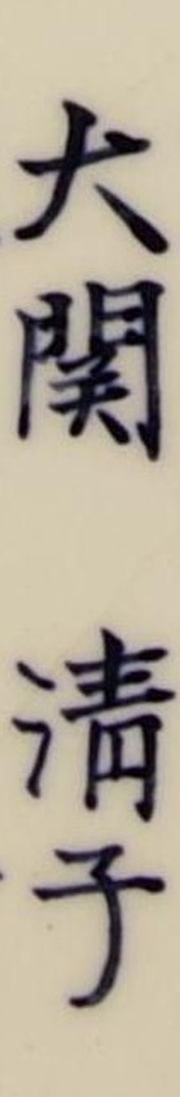大関清子
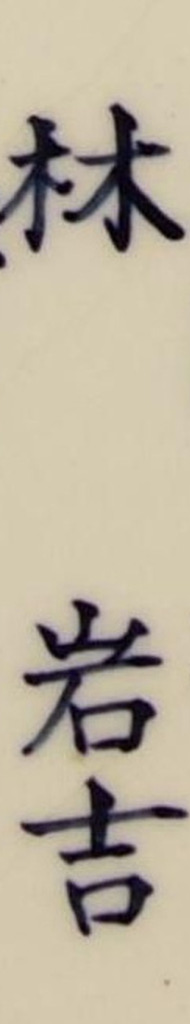林岩吉
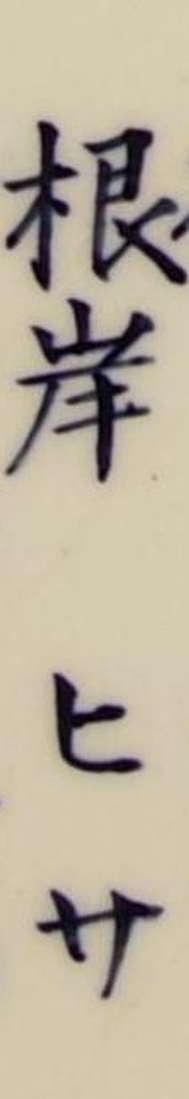根岸ヒサ
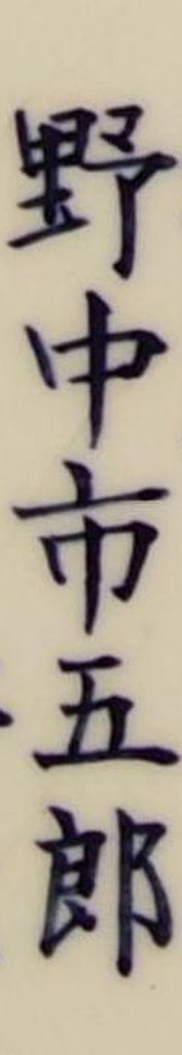野中市五郎
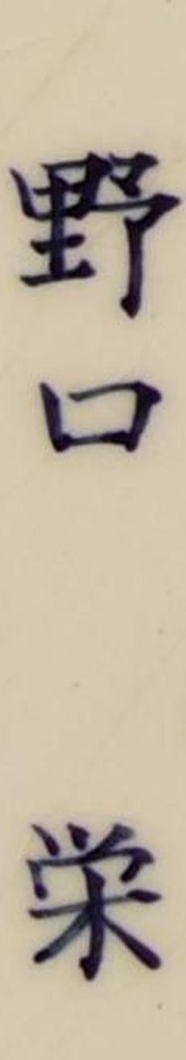野口栄
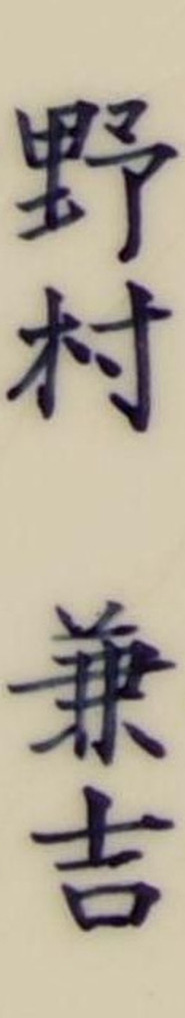野村兼吉
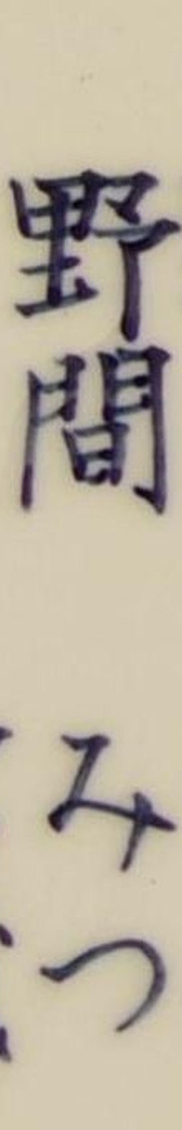野間みつ

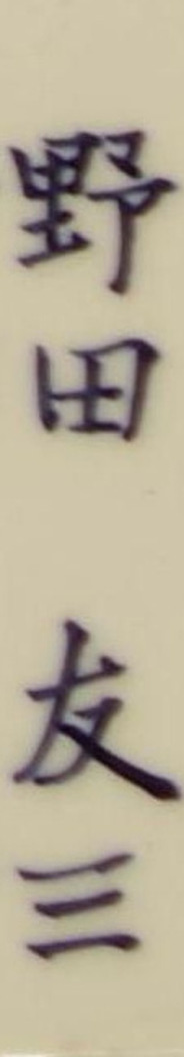野田友三
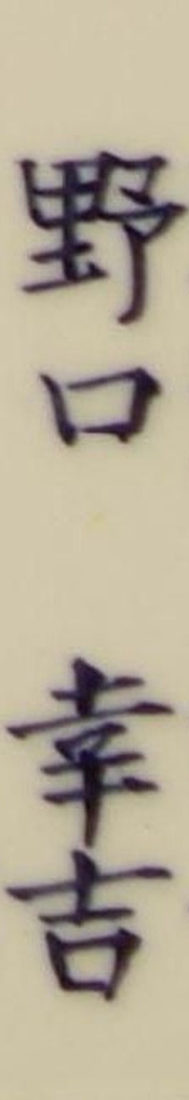野口幸吉
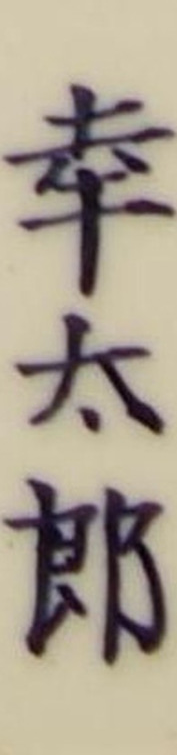幸太郎
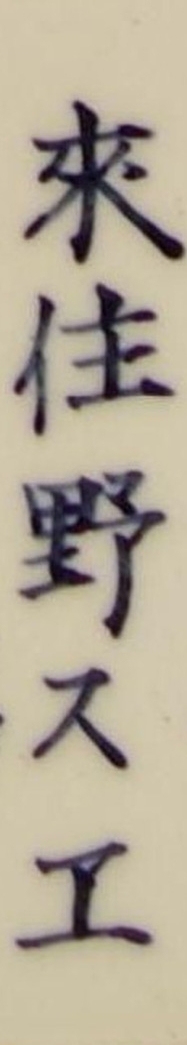来住野スエ
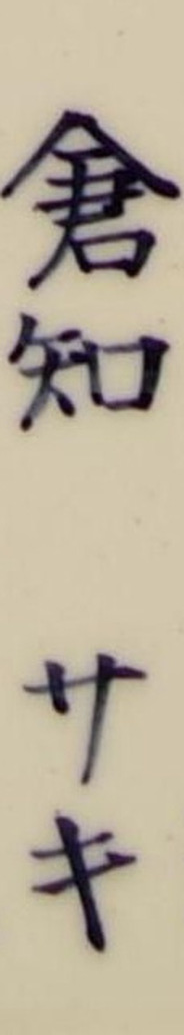倉知サキ
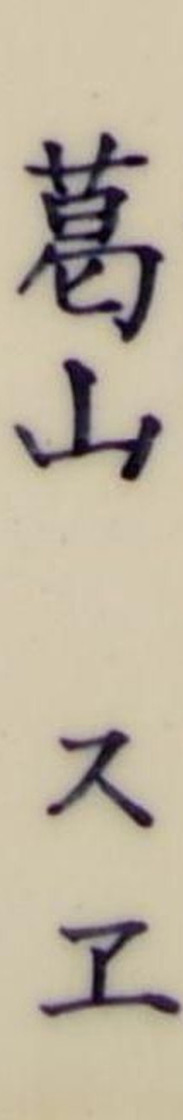葛山スエ
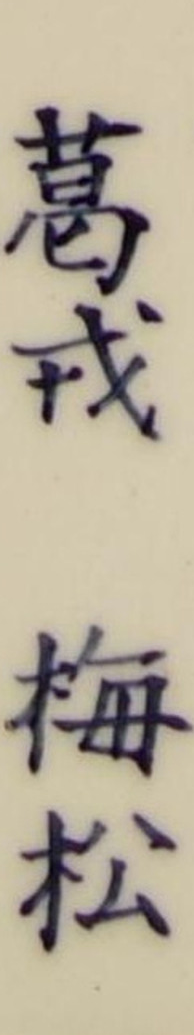葛戎梅松
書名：E~L
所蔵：高野山金剛峯寺
